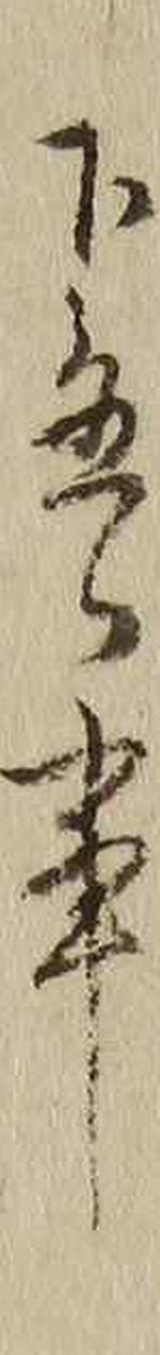下置候事
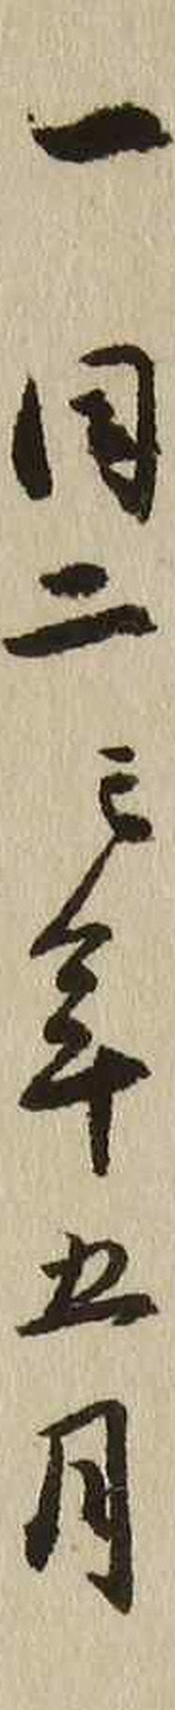一同二巳年五月
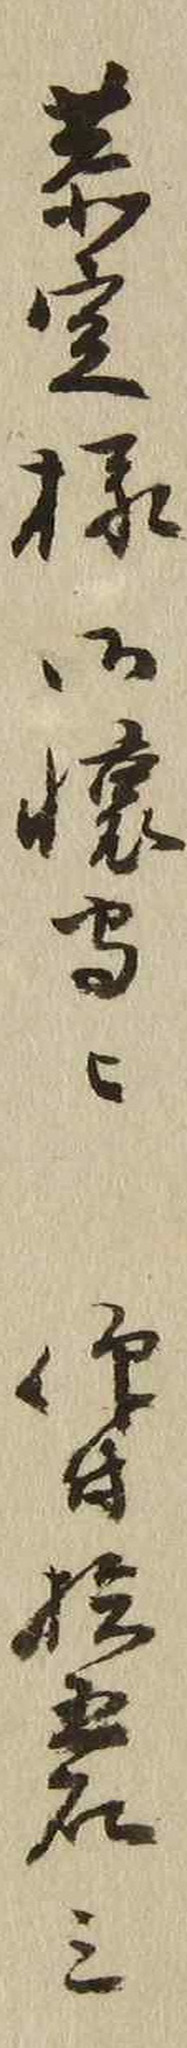恭定様御懐守被仰付拾五石三
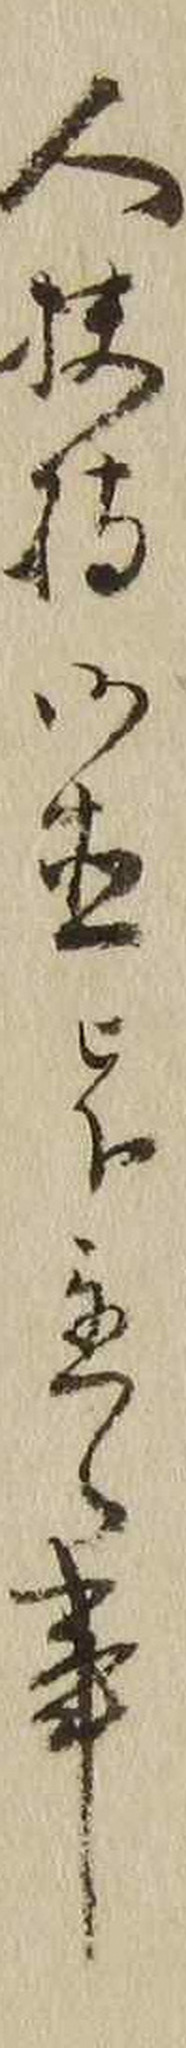人扶持御直被下置候事
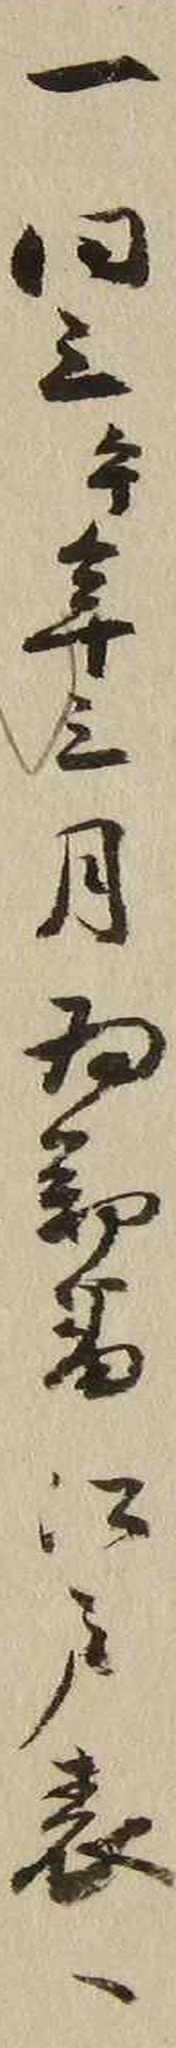一同三午年三月為勤番江戸表へ
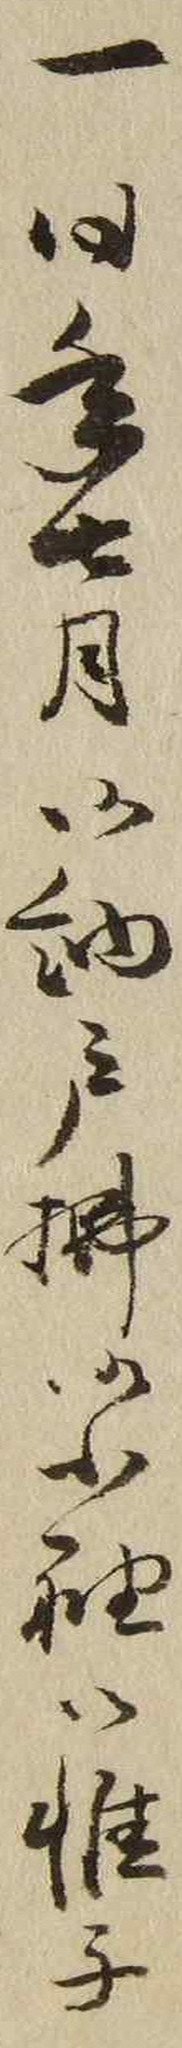一同年七月御納戸払御小袖御帷子
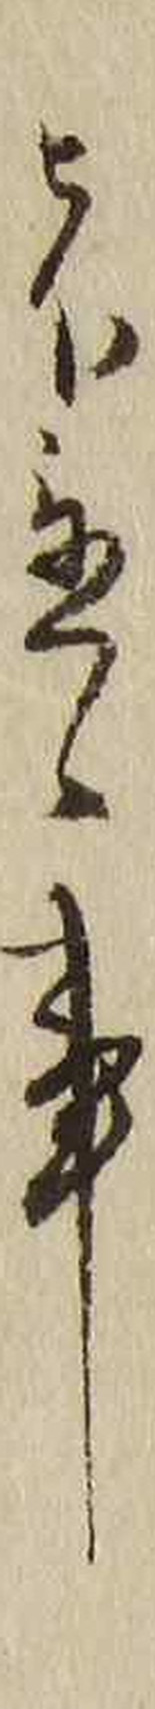被下置候事
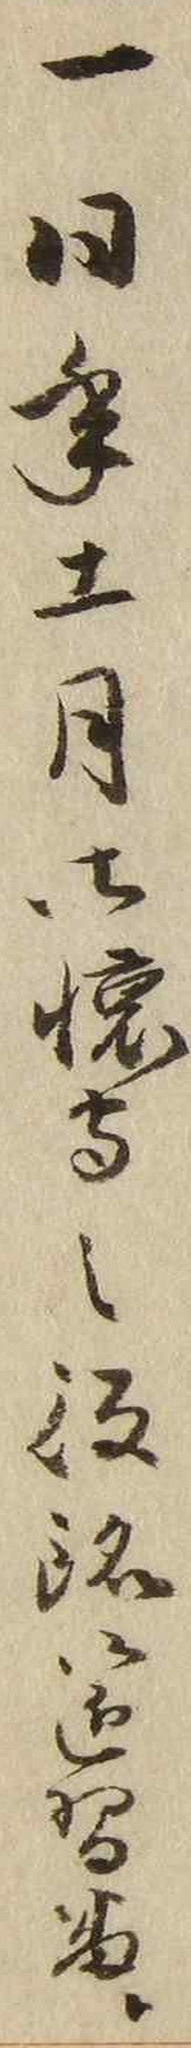一同年十一月御懐守之役銘御近習番ト

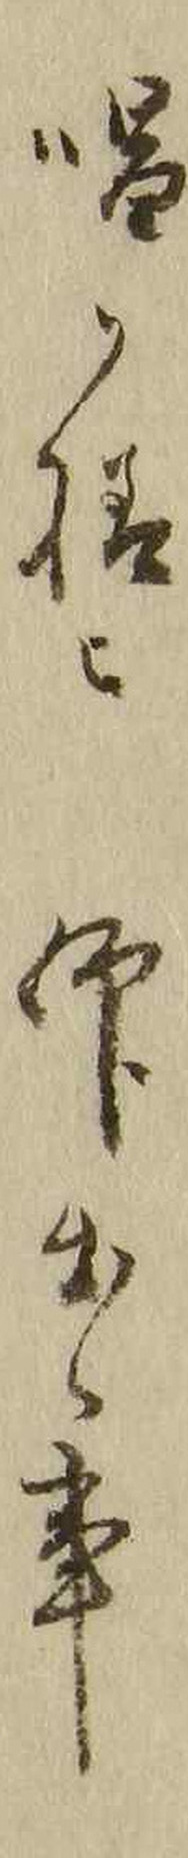唱候様被仰出候事
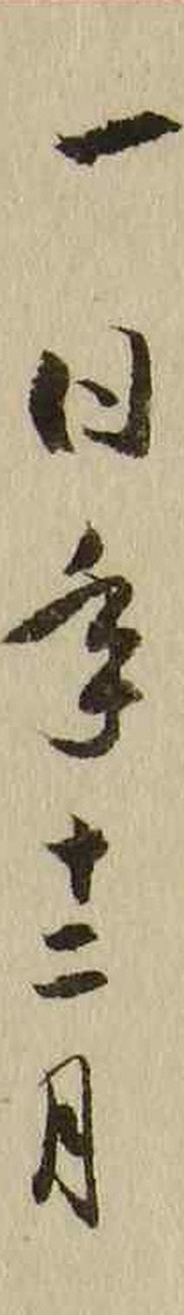一同年十二月
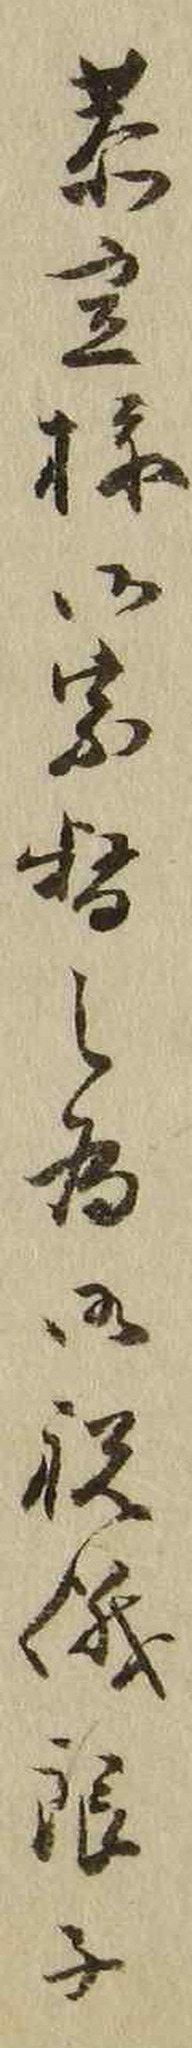恭定様御家督之為御祝儀銀子
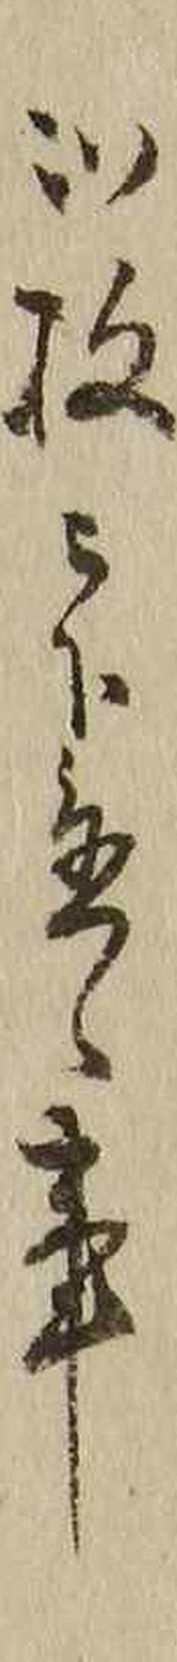御碓子被下置候事
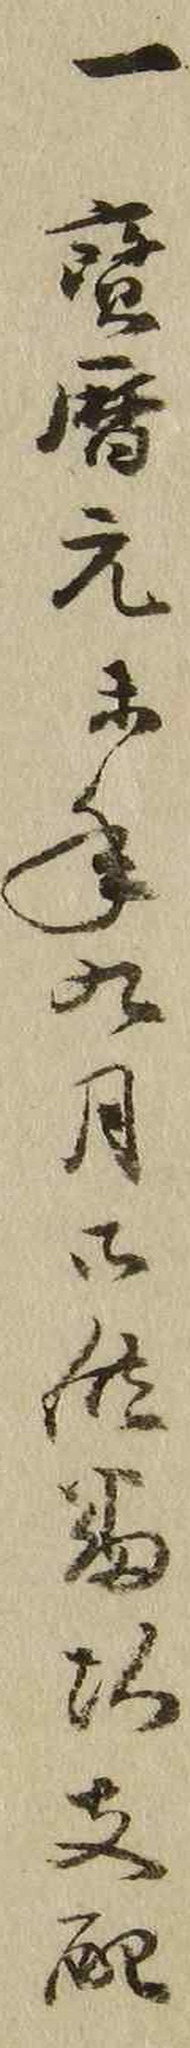一宝暦元未年九月御供番頭支配
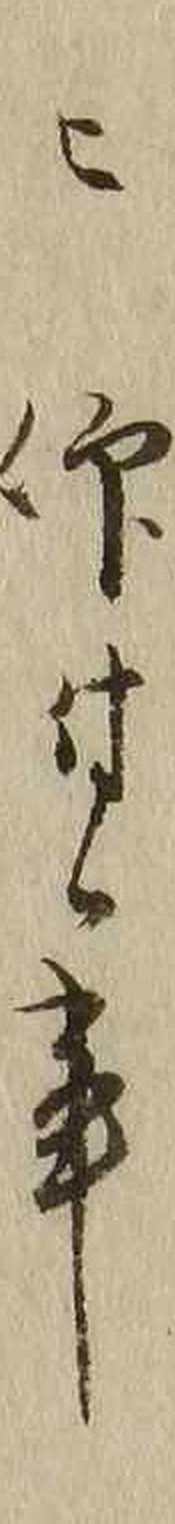被仰付候事
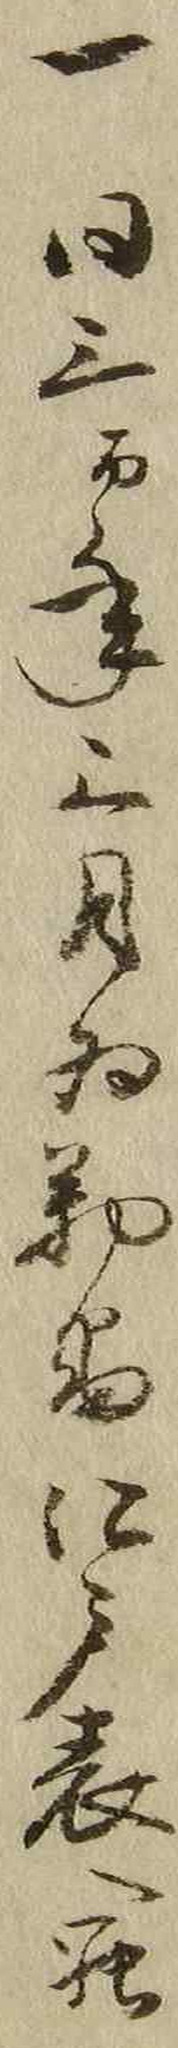一同三酉年三月為勤番戸表へ罷
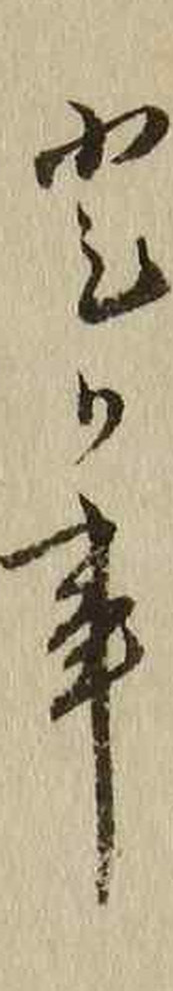登候事
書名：諸士系譜　巻之232　け之部1
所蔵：会津若松市立会津図書館
